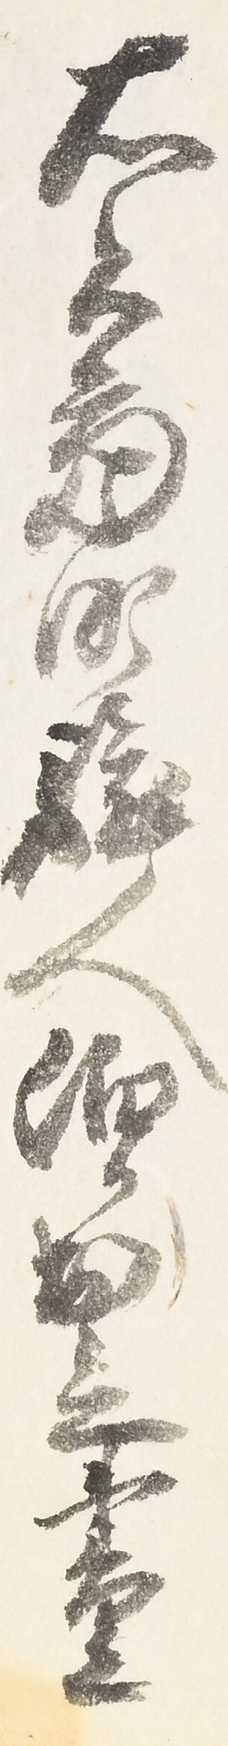右者当町旅人泊リ出立書上
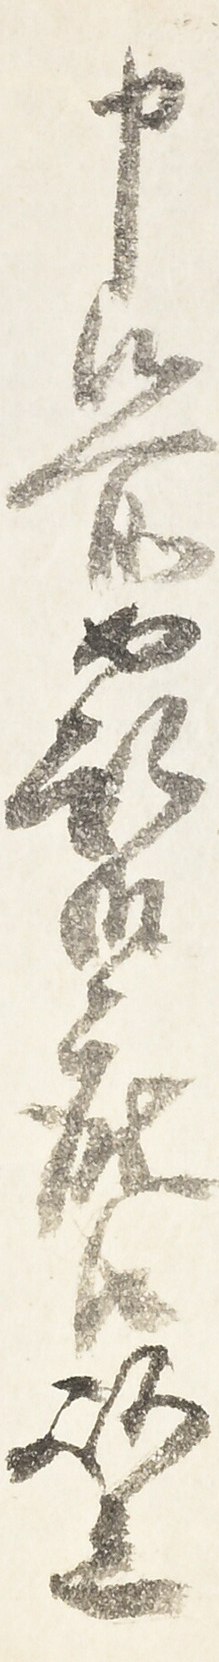申候所如斯御座候以上
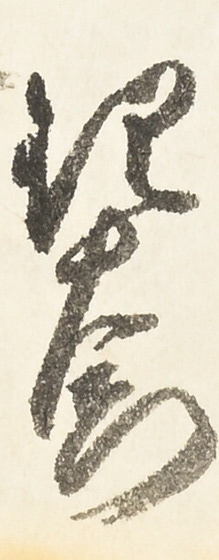酉理右衛門
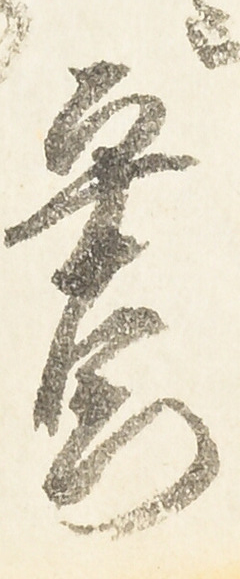平右衛門
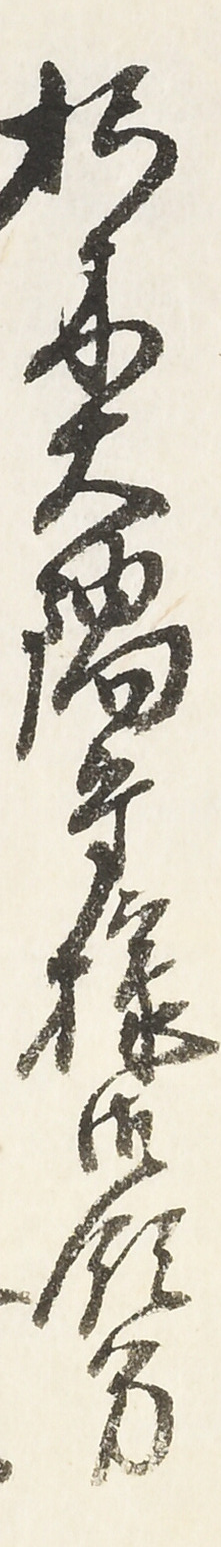朽木大隅守様御領分
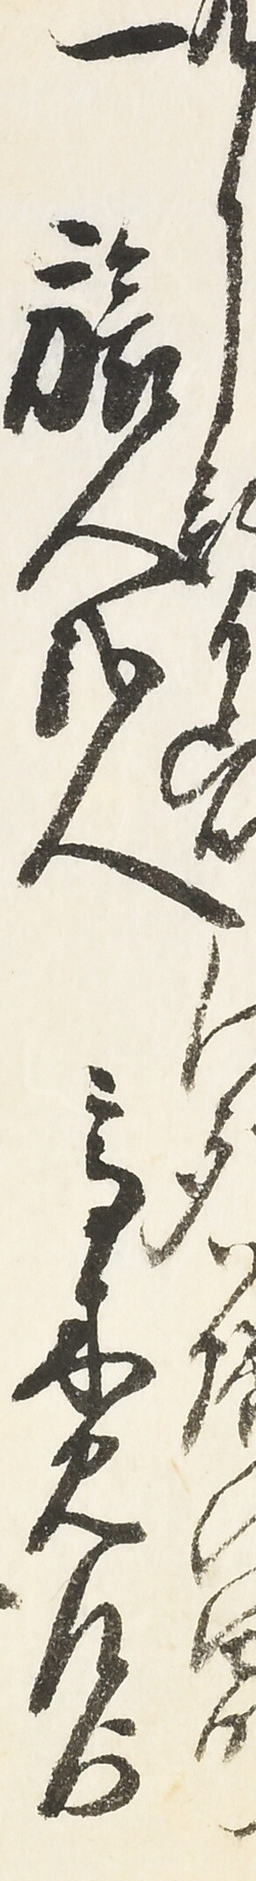一旅人弐人高木忠左衛門
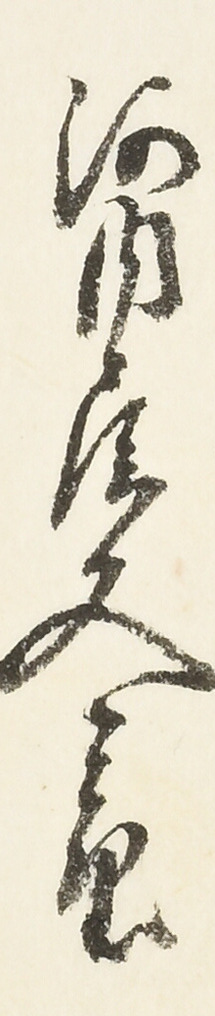河内屋又兵衛
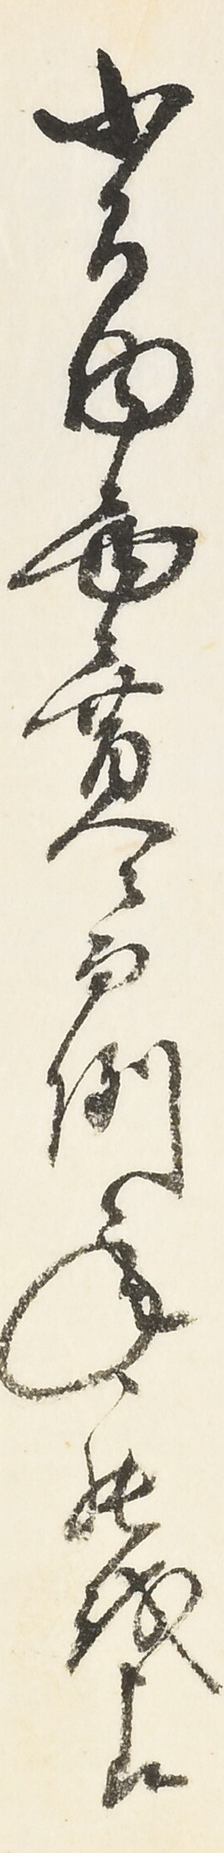小間物商売ニ而例年罷越申候
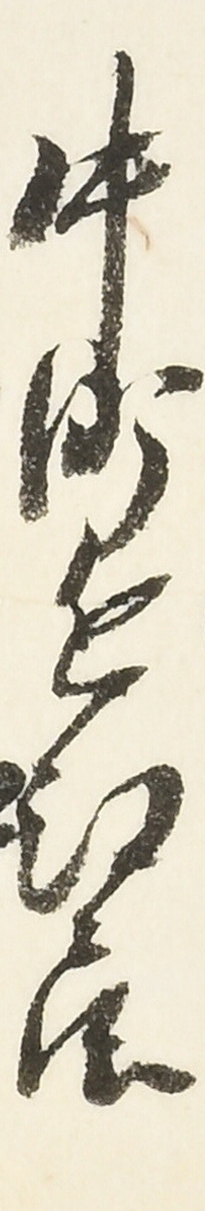中町近江屋
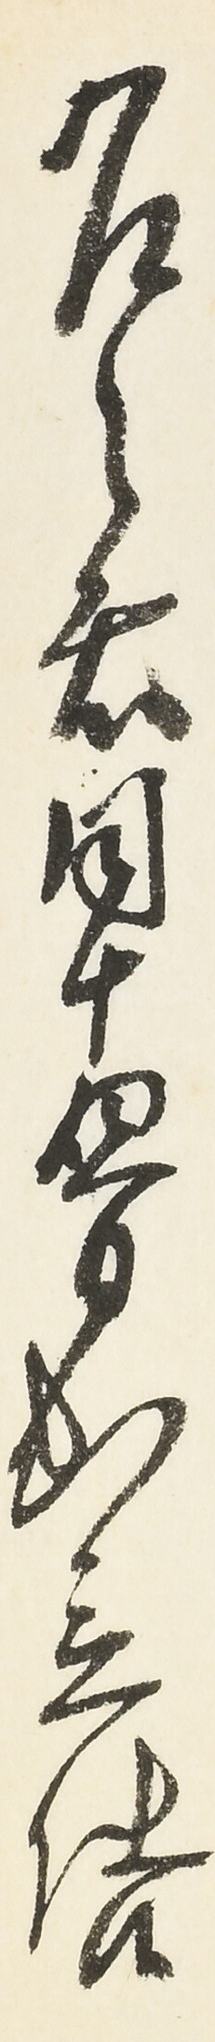右之者同十四日出立仕候
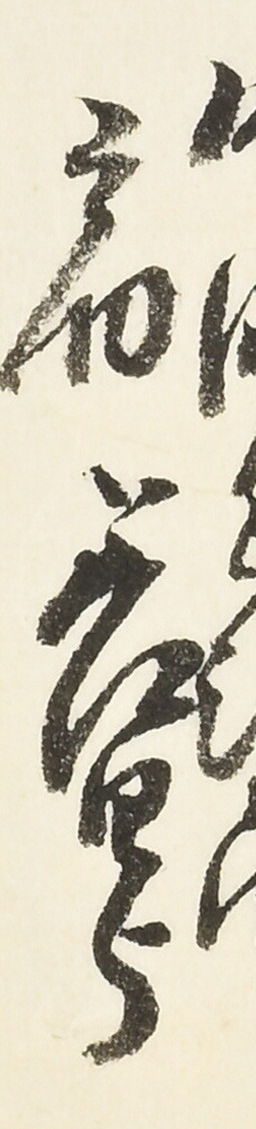宿善四郎
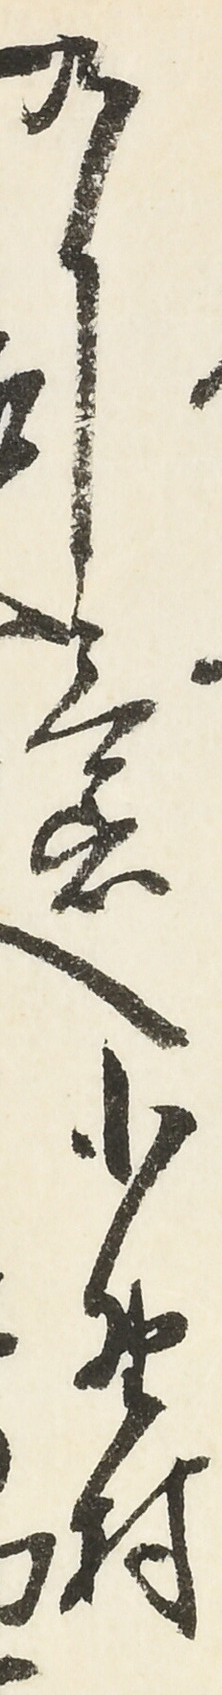九月三日着小野村
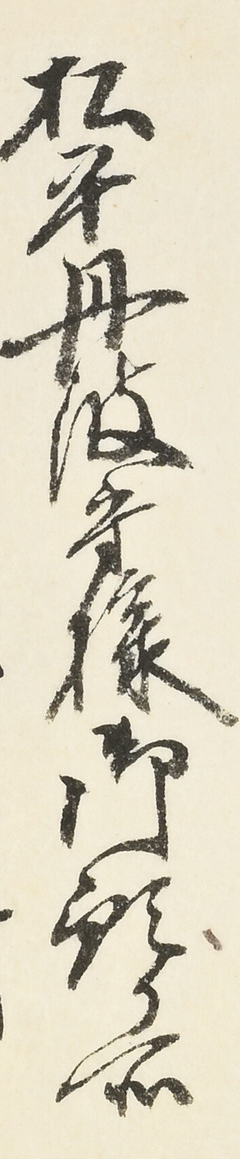松平丹波守様御預リ所
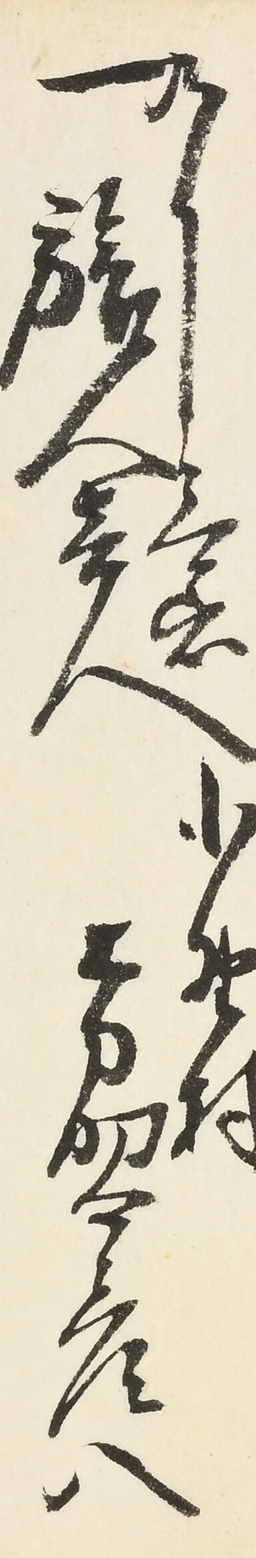一旅人壱人上州や彦八
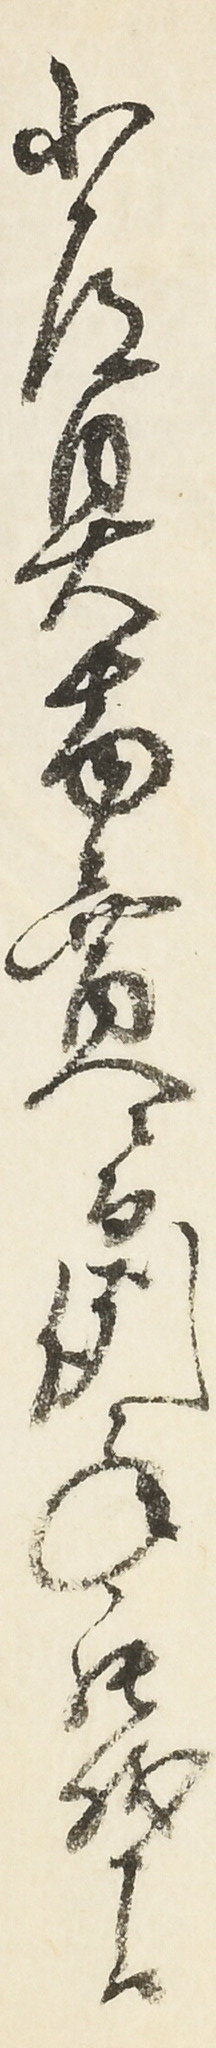小道具商売ニ而例年罷越申候

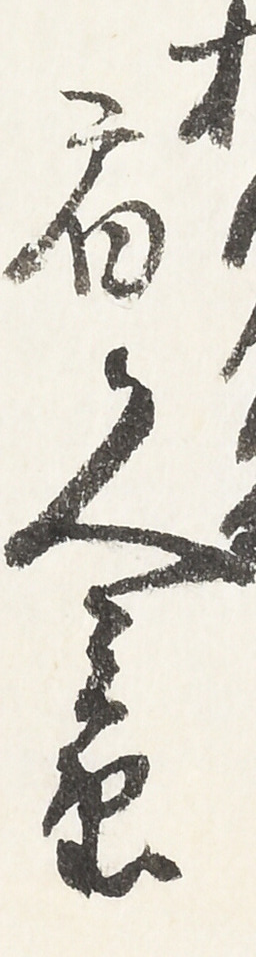宿久兵衛
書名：町中旅人泊控帳
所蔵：伊那市立高遠町図書館・合同会社AMANE
